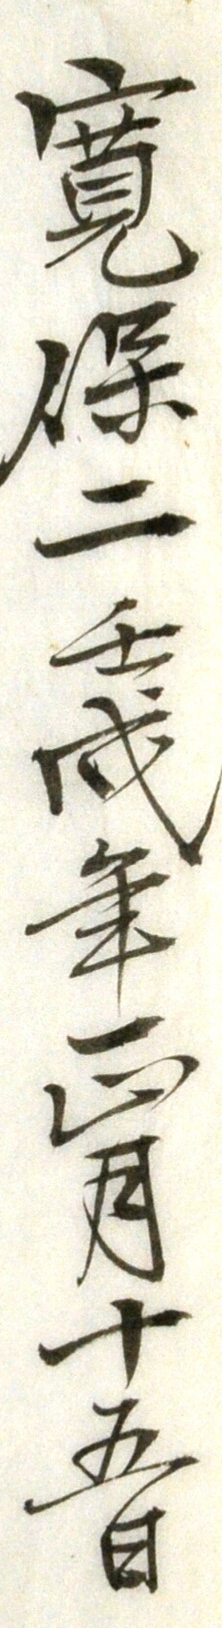寛保二壬戌正月十五日

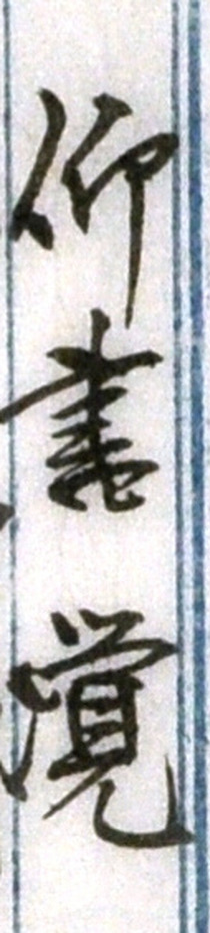仰書覚
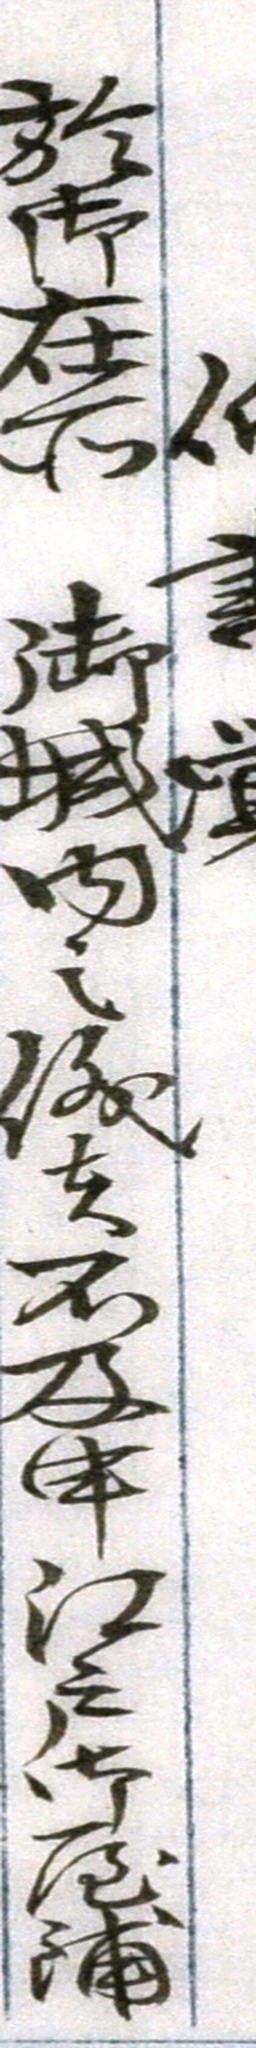一於御在所御城内之儀者不及申江戸御屋鋪
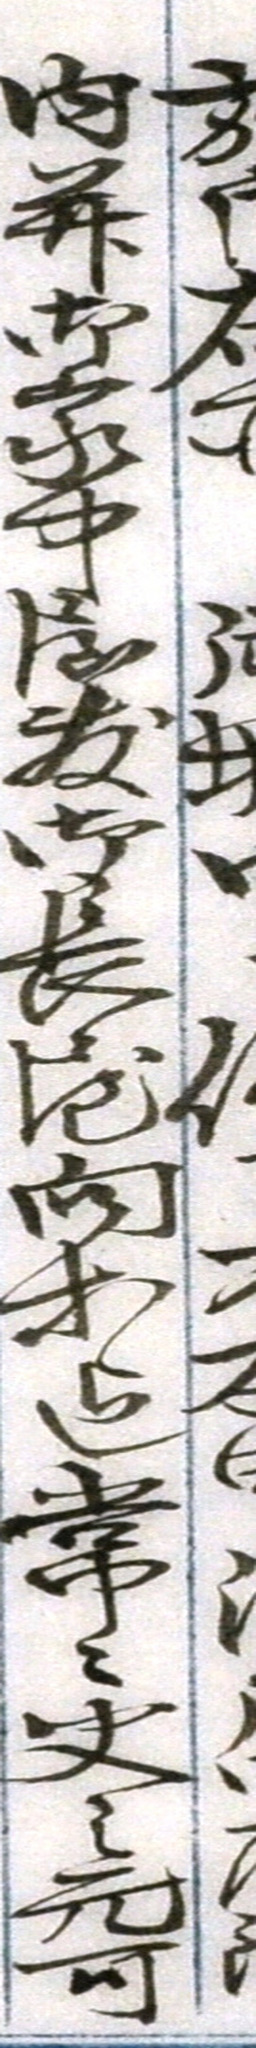内幷御家中屋敷御長屋向等迄常々火之元可
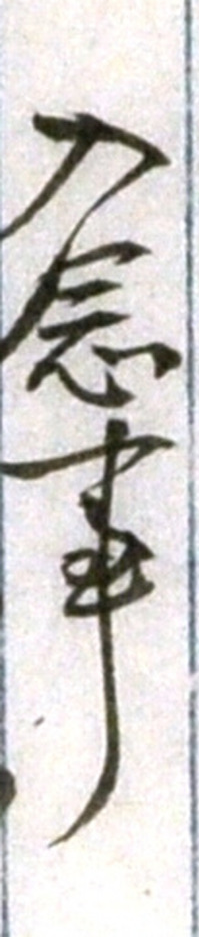入念事
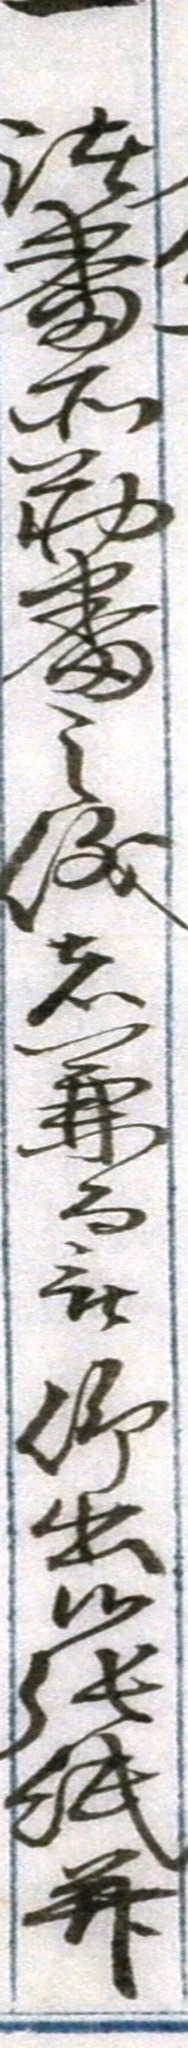一諸番所勤番之儀者兼而被仰出候張紙幷
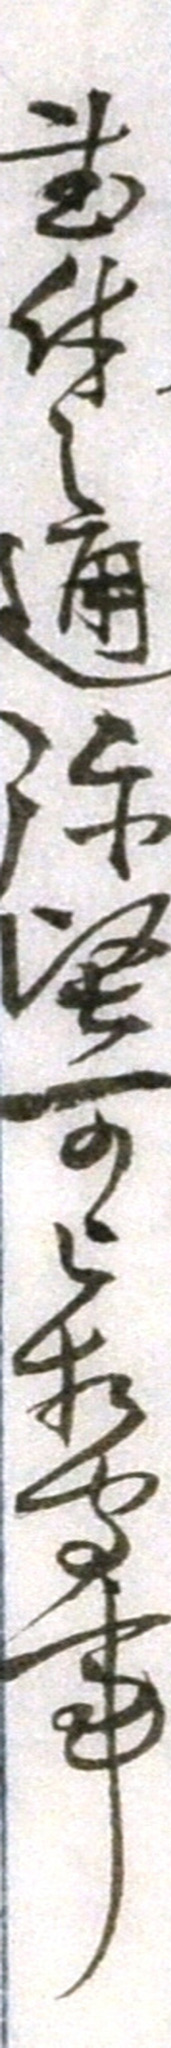書付之通弥堅く可被相守事
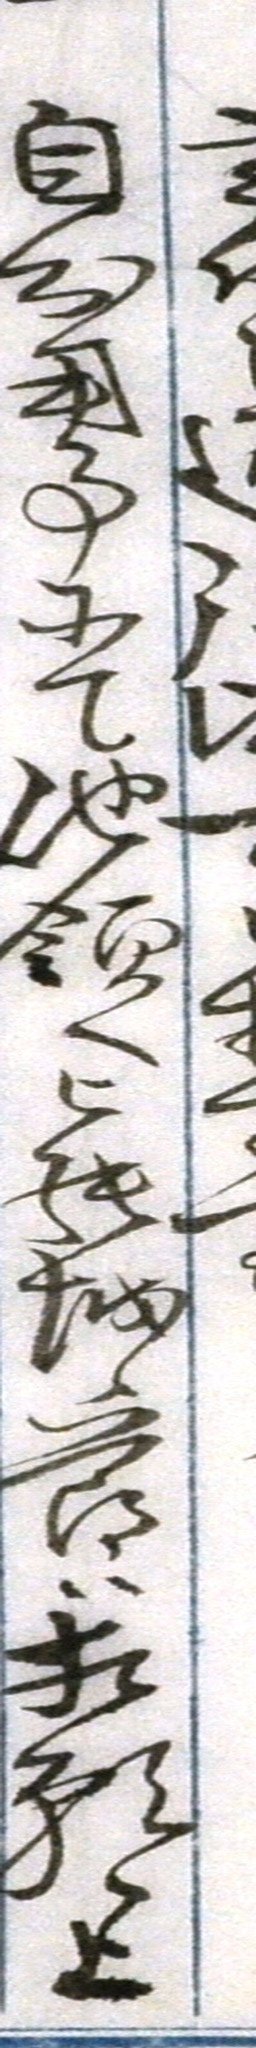一自分用事にて他領へ罷越候節ハ相願候上
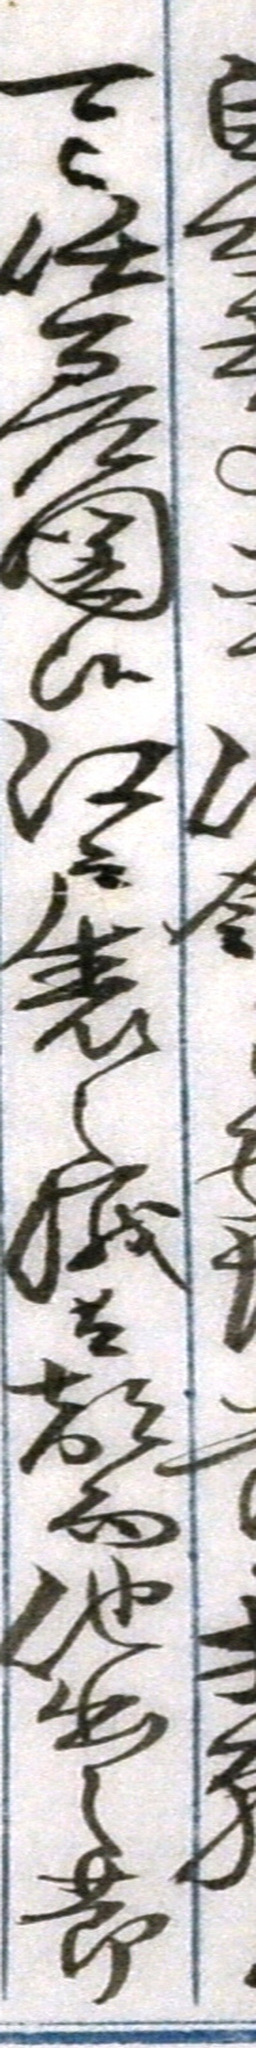可被任差図候江戸表之儀者都而他出之節
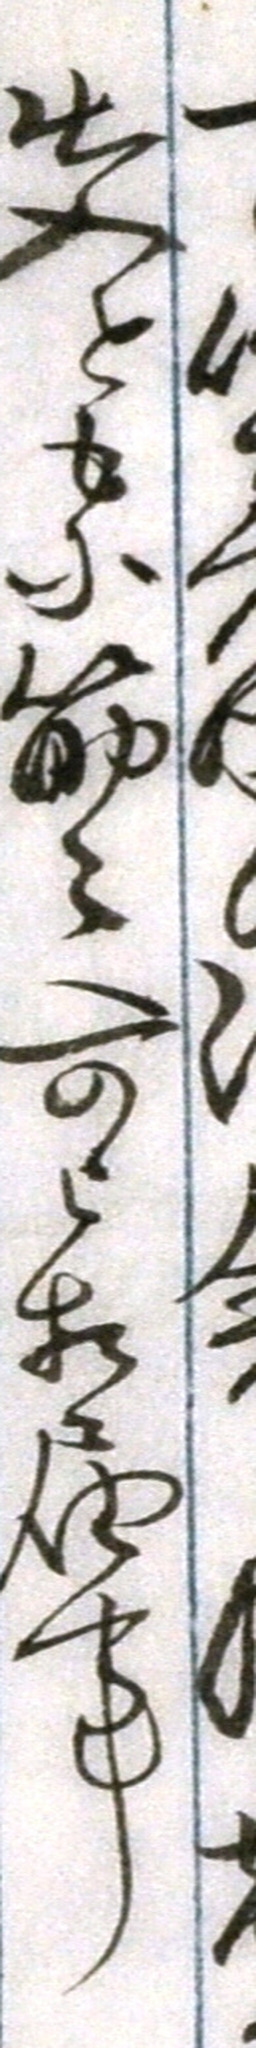出入ともに筋々へ可被相届事
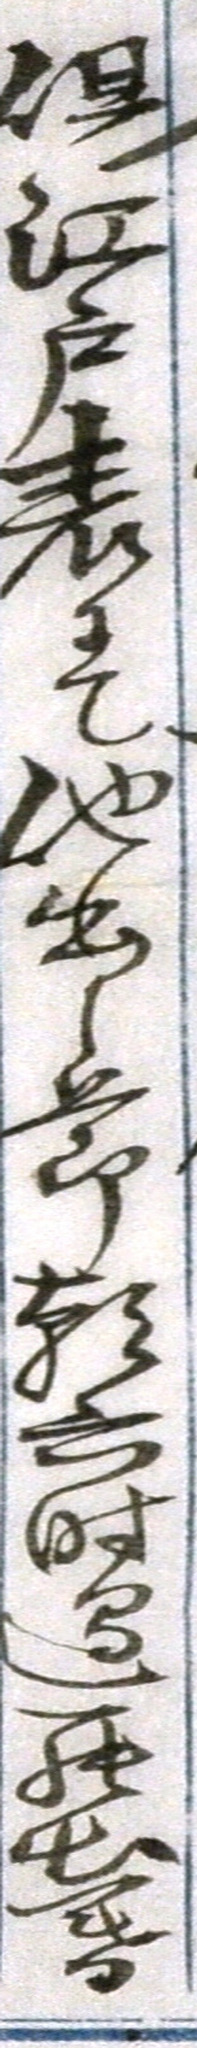但江戸表にて他出之節朝六時過罷出暮
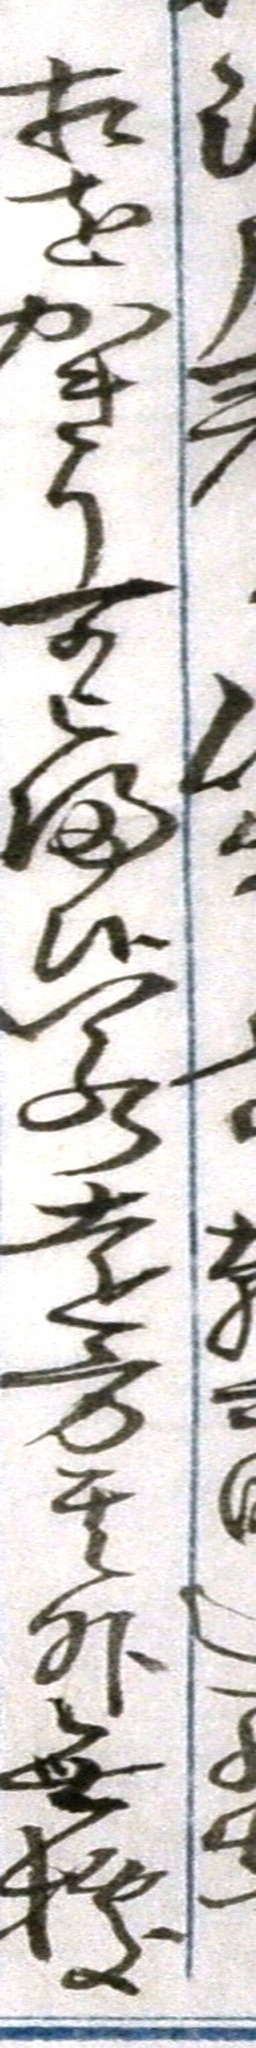相をかきり可被帰候若遠方其外無拠
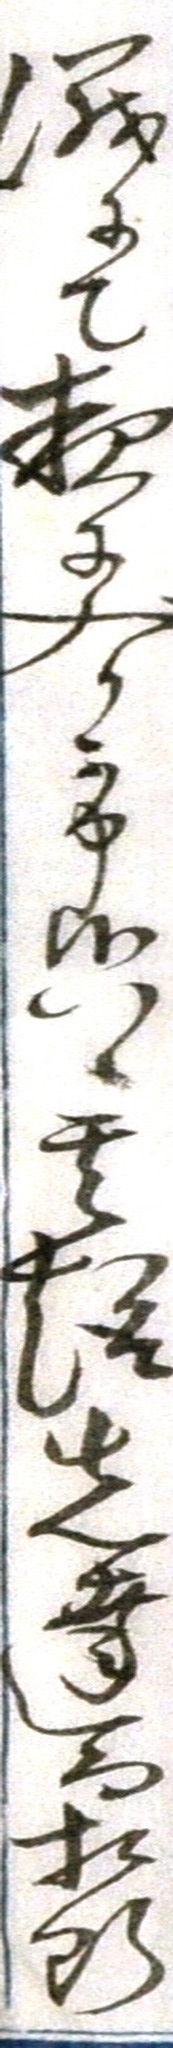儀にて夜入り可申候はヽ其趣先達而相断

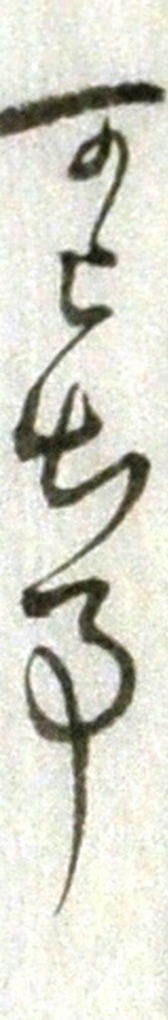可被出事
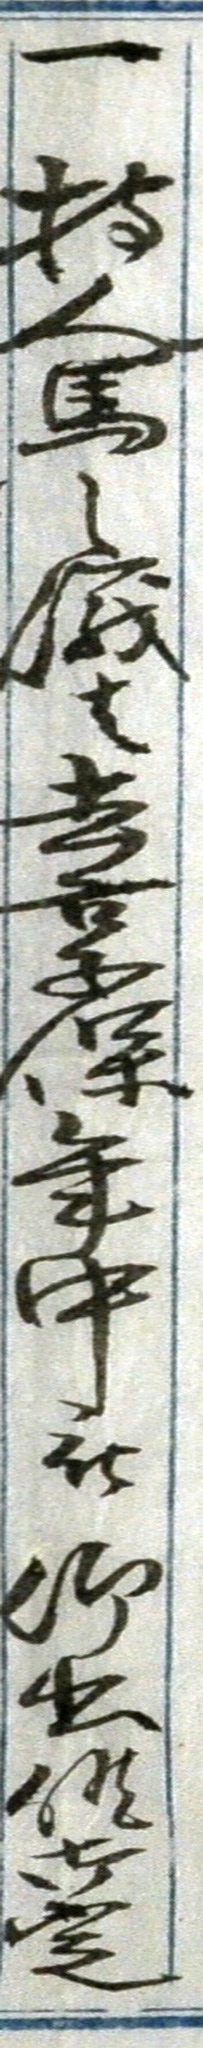一持人馬之儀者去享保年中被仰出候御定
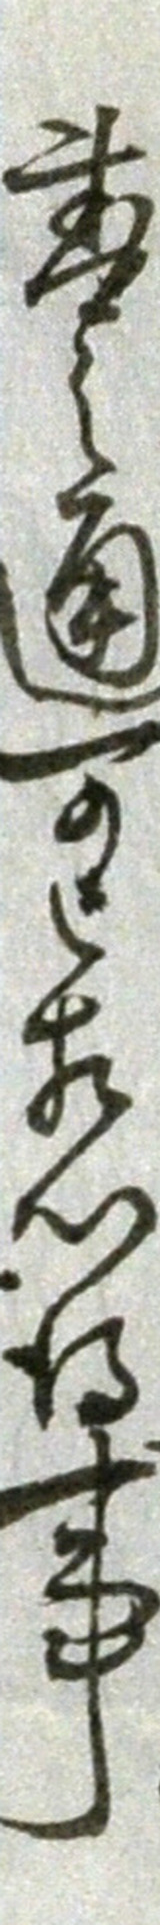書之通可被相心得事
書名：仰書覚
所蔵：伊那市立高遠町図書館・合同会社AMANE
